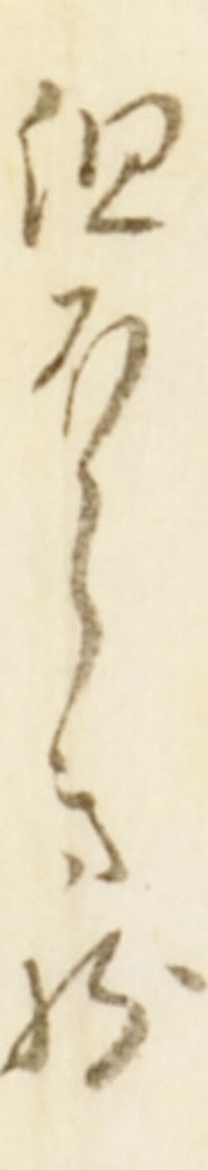但ほうき持

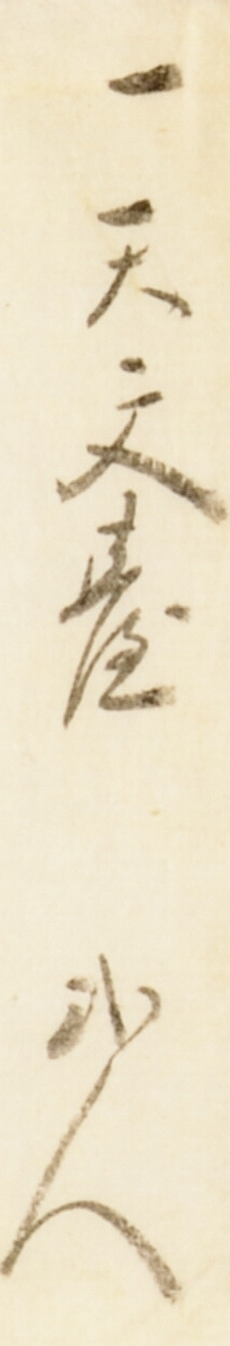一天文台弐人
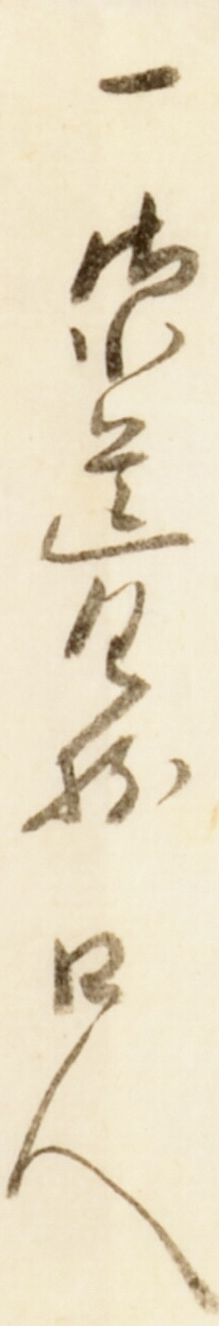一御小道具持四人
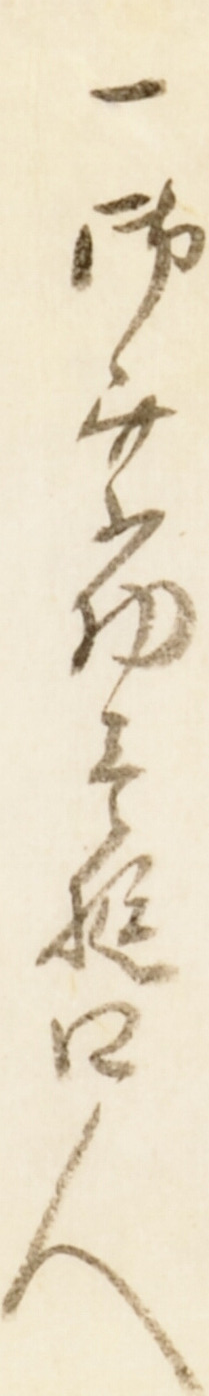一御乗物壱挺四人
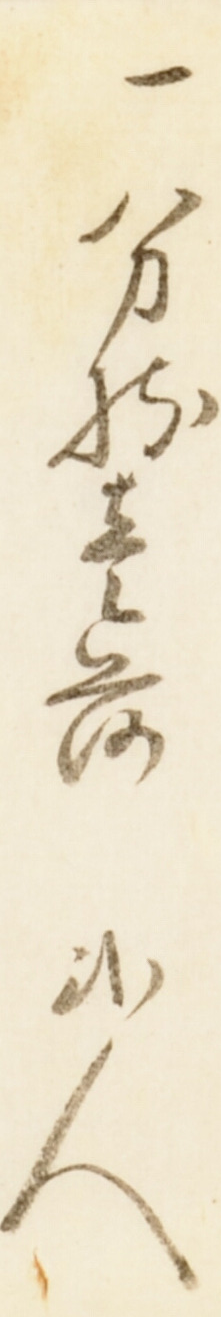一分持壱荷弐人
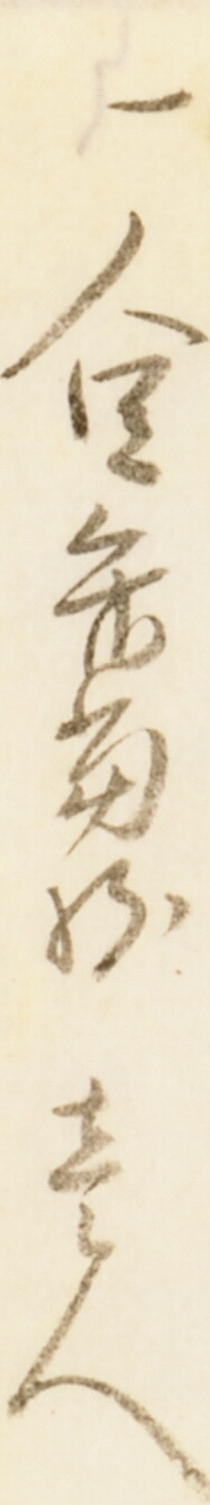一人足弁当持壱人
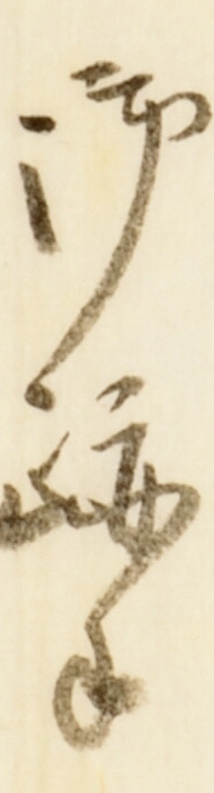御跡手
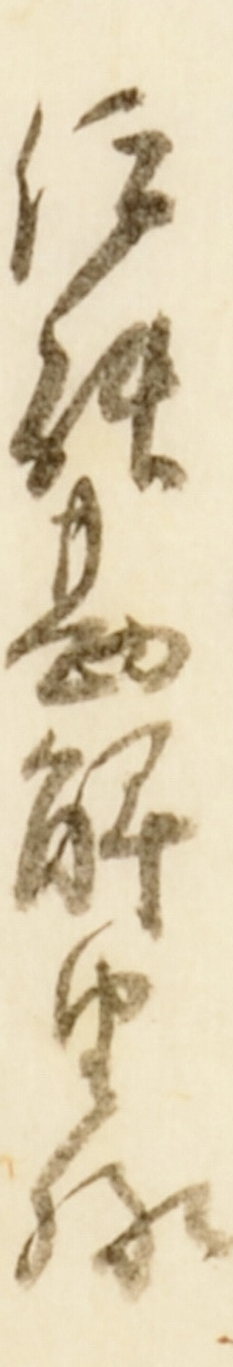伊能勘解由様

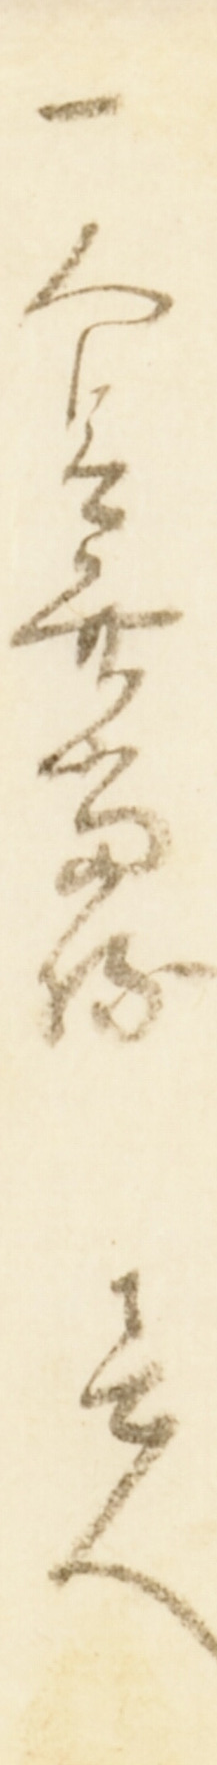一人足弁当持壱人
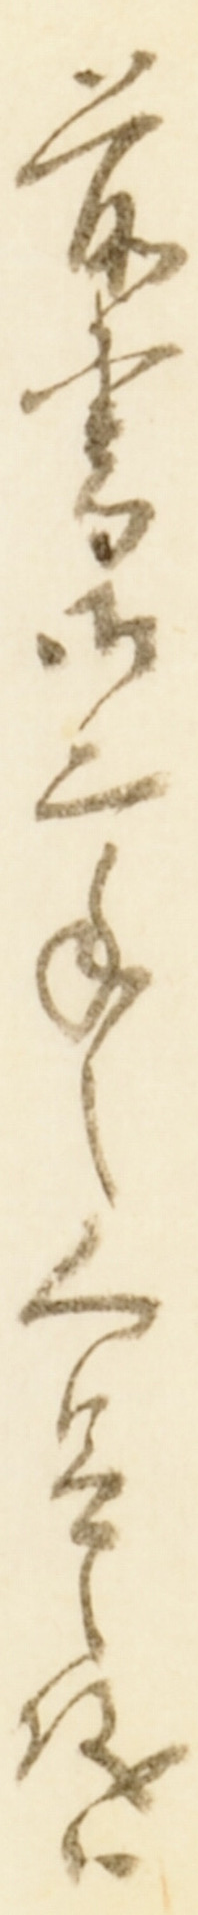前書御二手之人足儀ハ
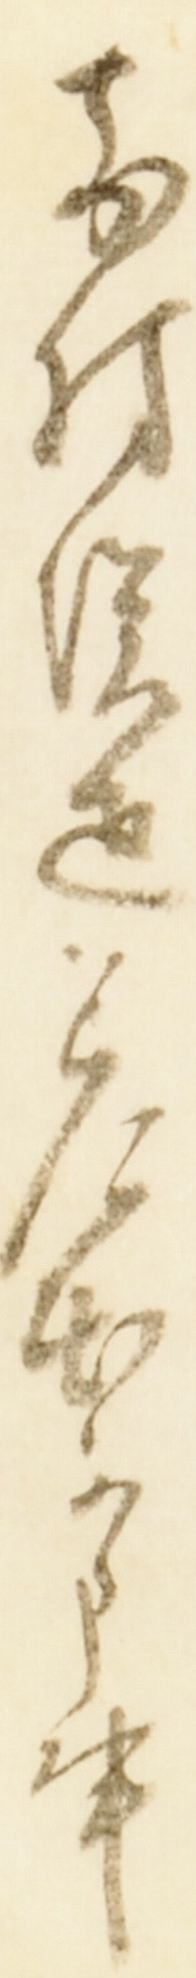前村境迄差出可申事
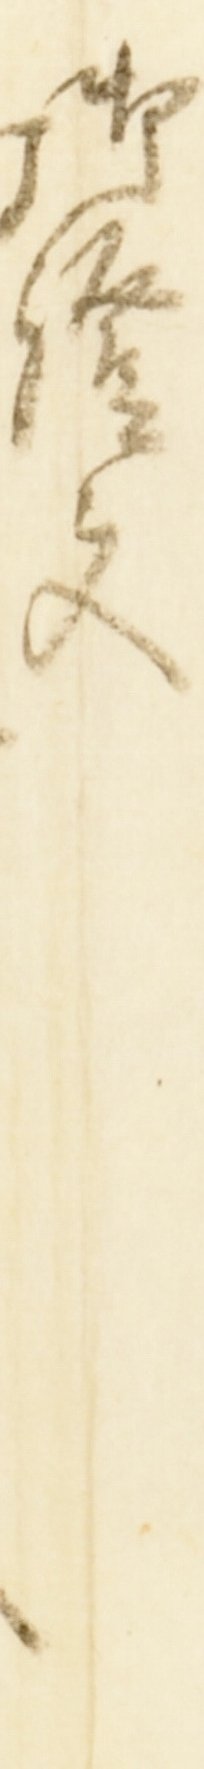御證文
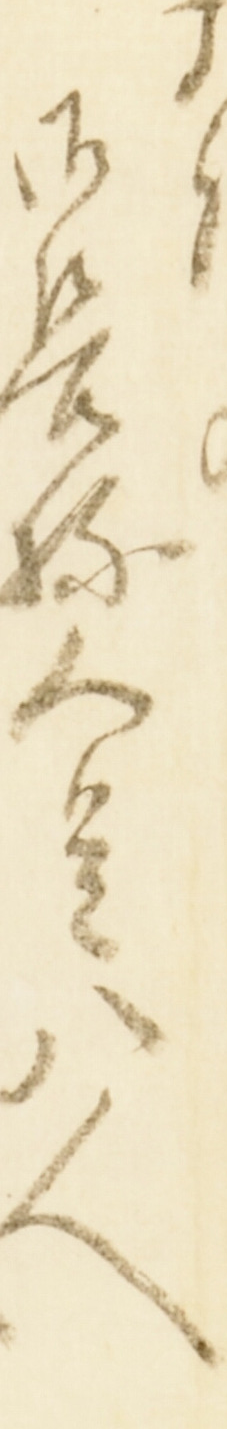御長持人足八人
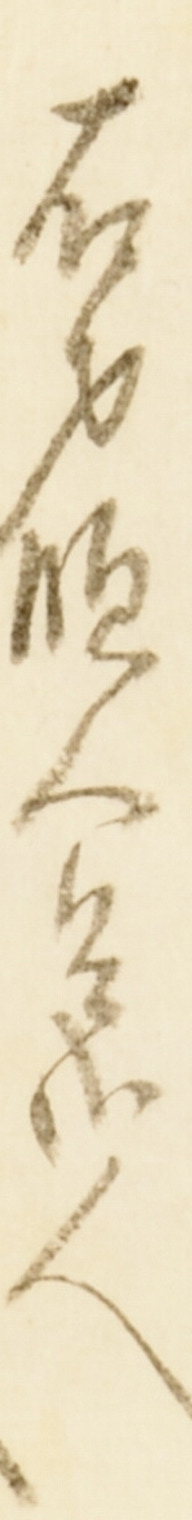右才領人足弐人
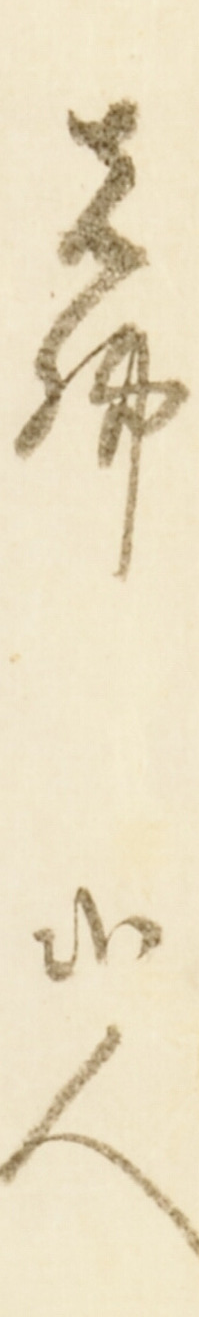先払弐人
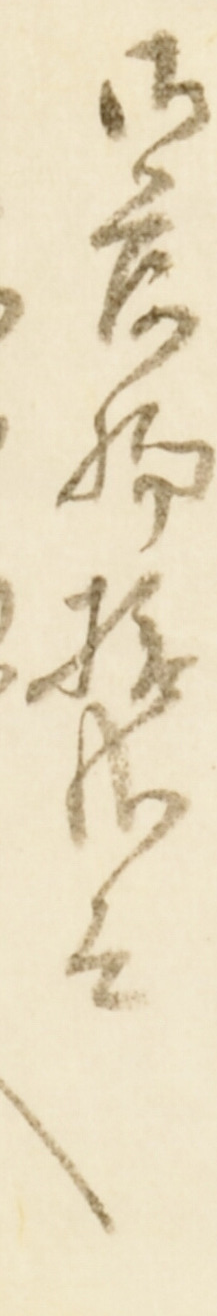御荷物拾弐者
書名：（覚）
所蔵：伊那市立高遠町図書館・合同会社AMANE
